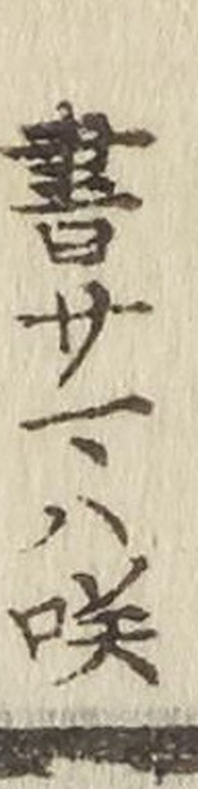書サマハ咲
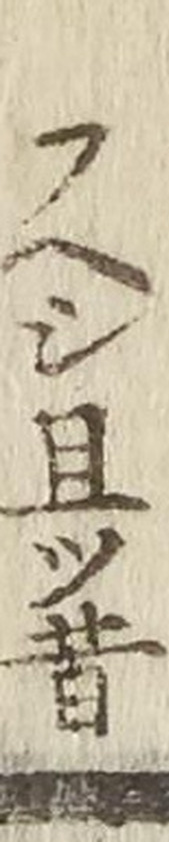フヘシ且ツ昔
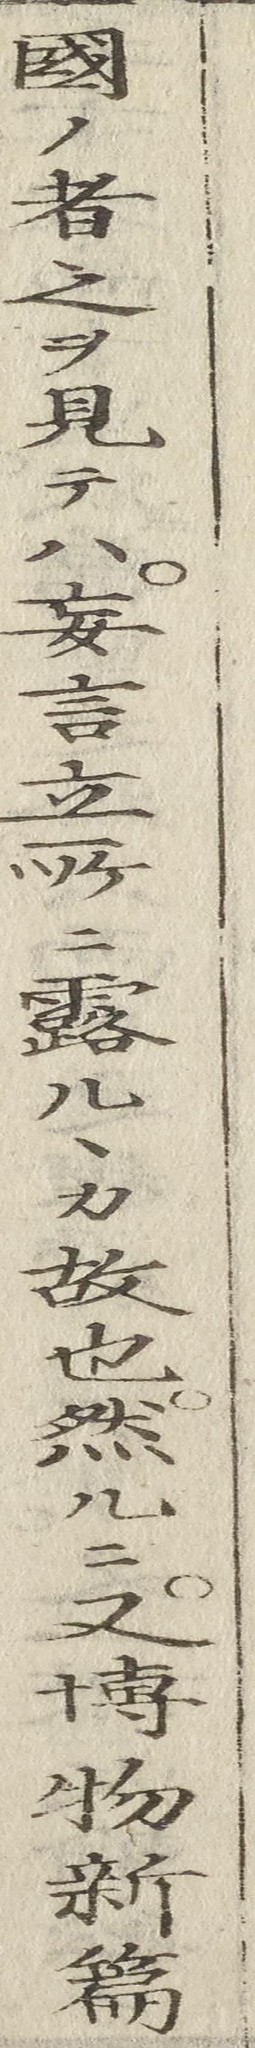国ノ者之ヲ見テハ。妄言立所ニ露ルヽカ故也。然ルニ。又博物新篇
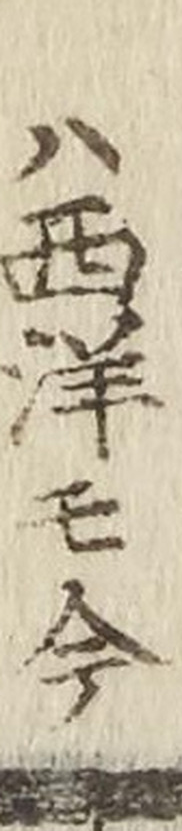ハ西洋モ今
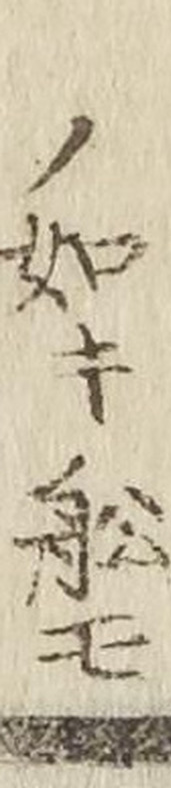ノ如キ舩モ
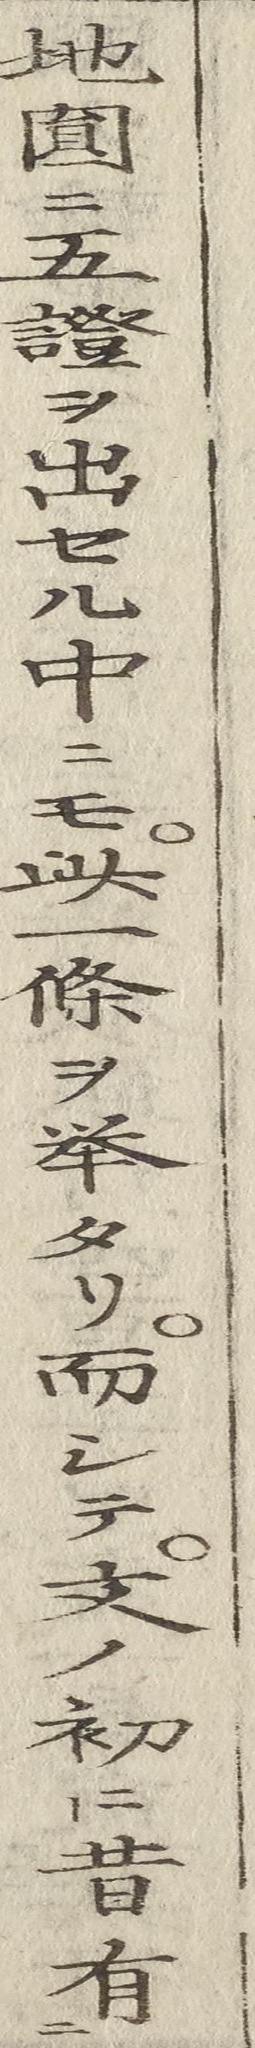地円ニ五証ヲ出セル中ニモ。此一条ヲ挙タリ。而シテ。文ノ初ニ昔有
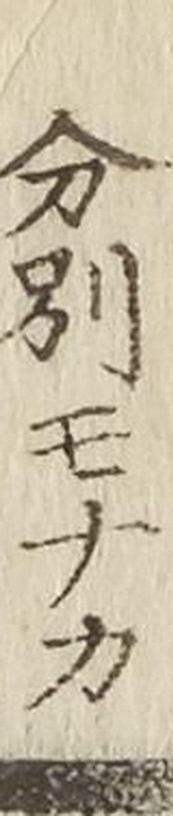分別モナカ
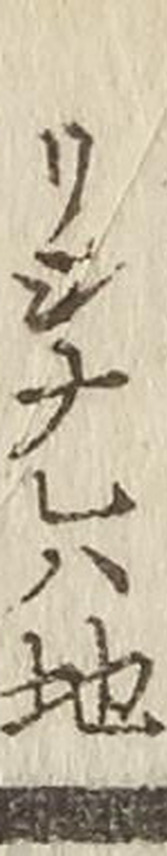リシナレハ地
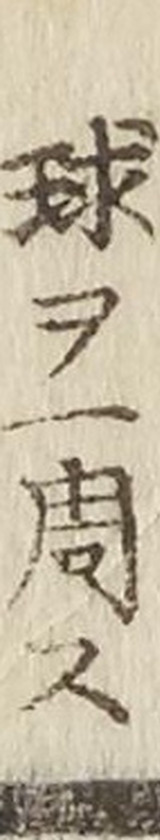球ヲ一周ス
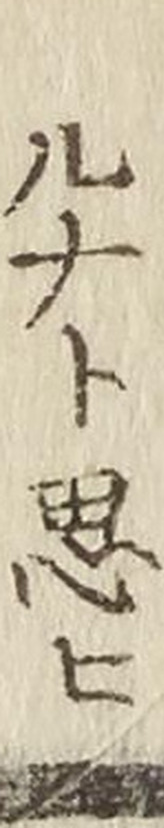ルナト思ヒ
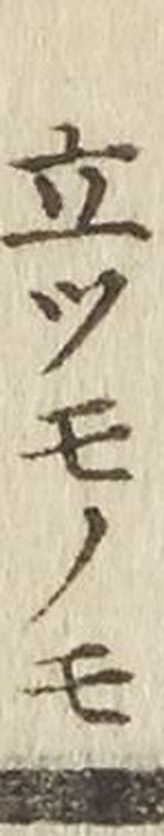立ツモノモ
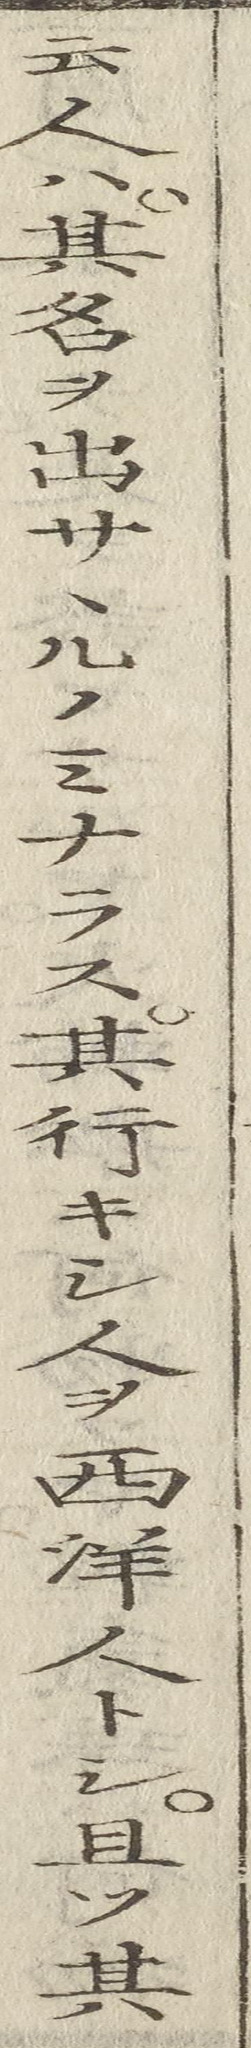云人ハ。其名ヲ出サヽルノミナラス。其行キシ人ヲ西洋人トシ。且ツ其
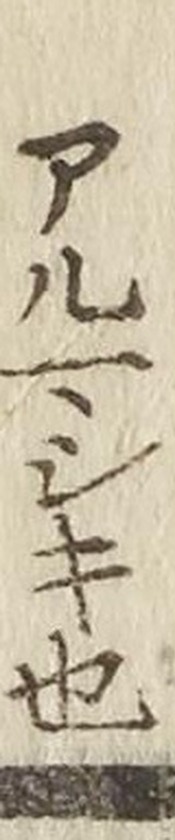アルマシキ也
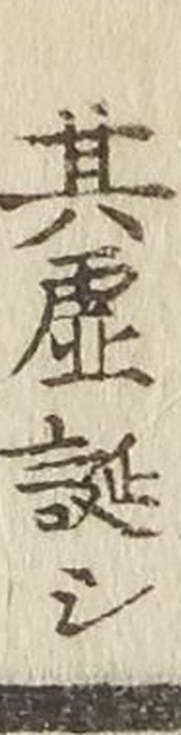其虚誕シ
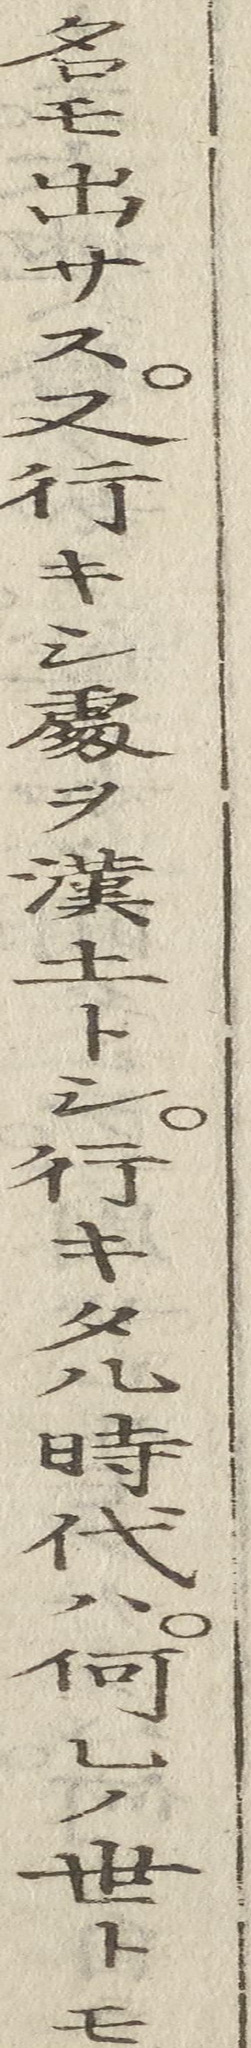名モ出サス。又行キシ処ヲ漢土トシ。行キタル時代ハ。何レノ世トモ
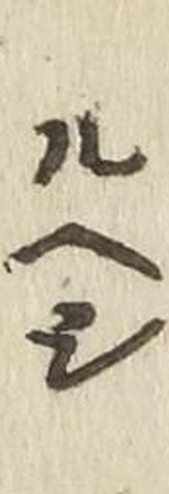ルヘシ
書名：護法新論　中
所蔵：東京大学地震研究所図書室 Earthquake Research Institute Library, The University of Tokyo, JAPAN
